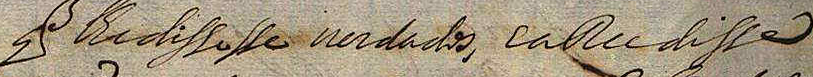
q̄ lhe dissesse uerdades, E a Ree disse
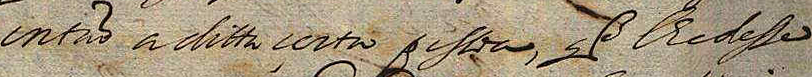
entaõ a ditta certa pessoa, q̄ lhe desse
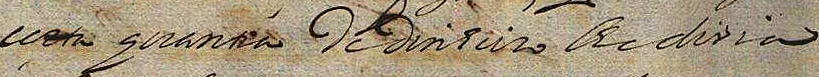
certa quantia de dinheiro lhe diria
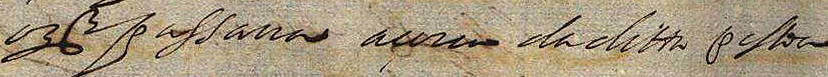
o q̄ passaua acerca da ditta pessoa
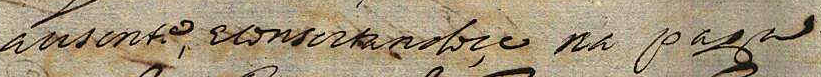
ausente, E consertandoce na paga
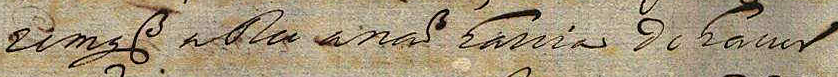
E em q̄ a Ree a naõ hauia de hauer
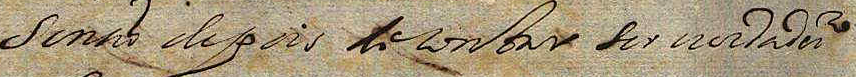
senaõ depois de constar ser uerdadeiro
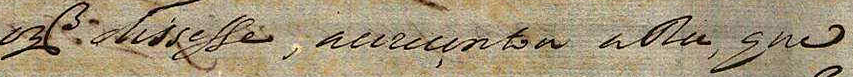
o q̄ dissesse, accrecentou a Ree, que
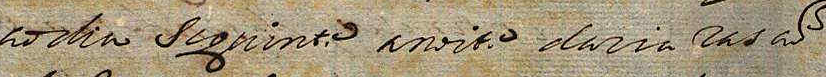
ao dia seguinte a noite daria rasaõ
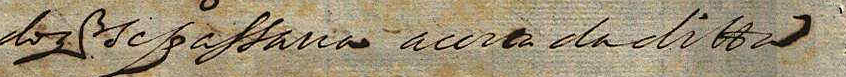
do q̄ se passaua acerca da ditta
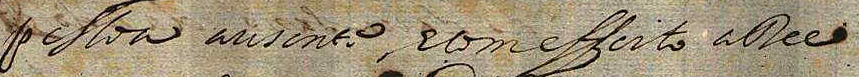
pessoa ausente, E com effeito a Ree
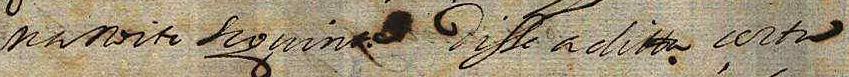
na noite seguinte disse a ditta certa
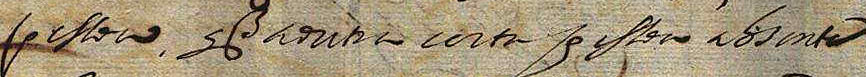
pessoa, q̄ a outra certa pessoa absente
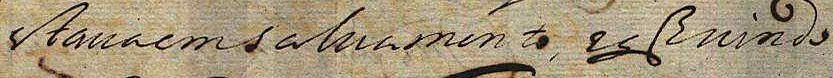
Estaua em saluamento, E q̄ uindo
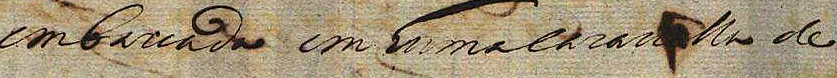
embarcada em huma carauella de
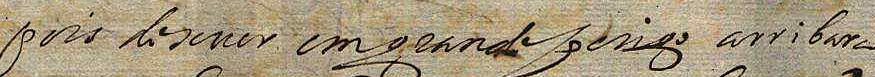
pois de se uer em grando perigo arribara
